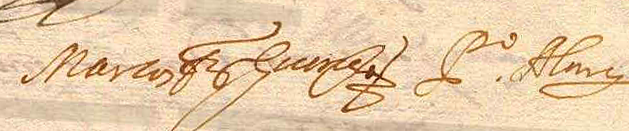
Marco Frz̄ Querrō Po. Alures
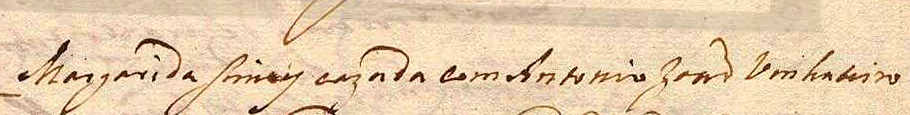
Margarida simoes cazada com Antonio Joaõ Vinhateiro
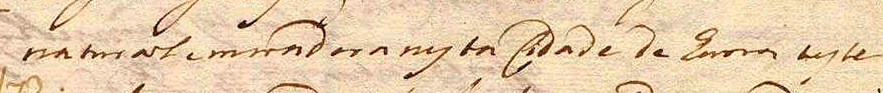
natural e moradora nesta Cidade de Euora teste
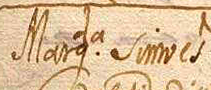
Marg.da Simoes̄.
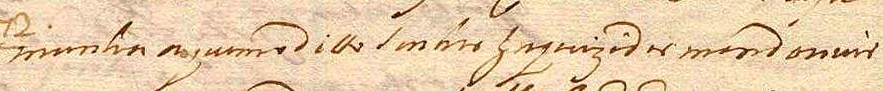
munha a quem o ditto Senhor Jnquizidor mandou uir
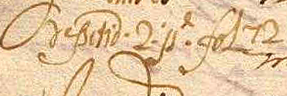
ressitid. 2. ss.e fol. 72
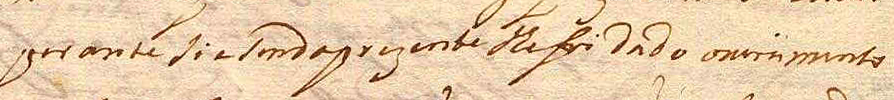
perante si e sendo prezente lhe foi dado o iuramento
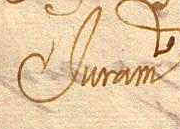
Juram.to
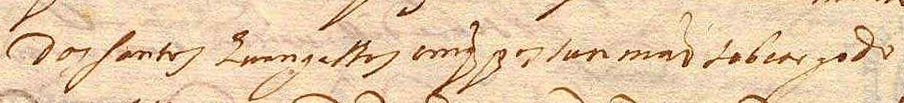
dos santos Euangelhos em q̄ pos sua maõ sob cargo do
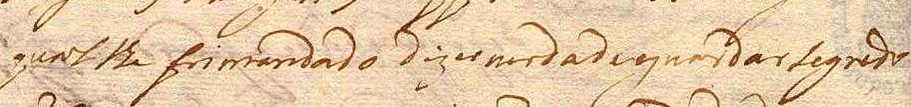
qual lhe foi mandado dizer uerdade guardar segredo
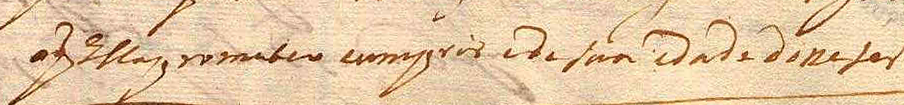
o q̄ Ella prometeo cumprir e de sua idade disse ser
